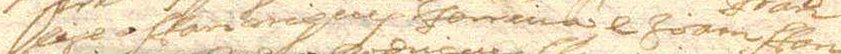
cisco Hanrriques Ferreira e Joam Han
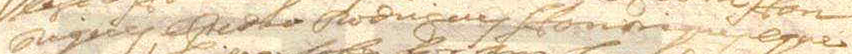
Riques e Pedro Rodrigues Hanrriques e que
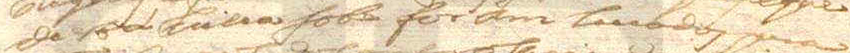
desta uilla sabe foram leuados pera
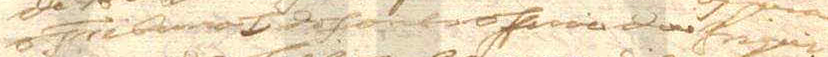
o Tribunal do santo officio da Jnqui
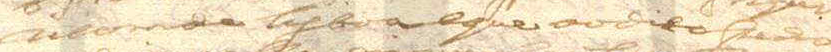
zicam de lisboa e que ao dito Pedro
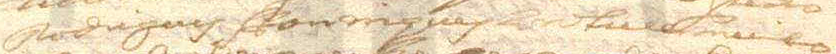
Rodrigues Hanrriques conhece muito
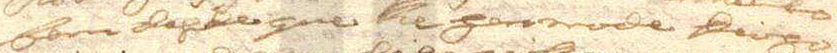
bem desde que he genrro de Diogo
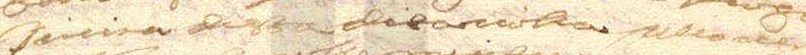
Pereira desta dita uilla pello uer
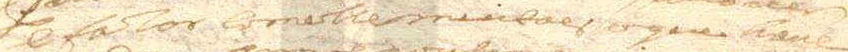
e falar com elle muitas o que haue
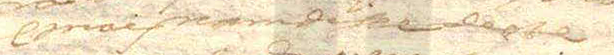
e mais nam disse deste
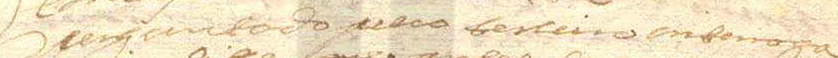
perguntado pello terceiro interroga
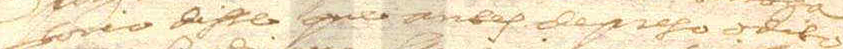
torio disse que antes de preso o dito
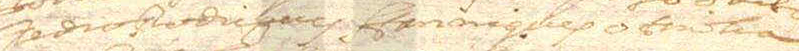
Pedro Rodrigues Hanrriques o tinha
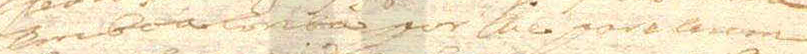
em boa conta por lhe parecerem
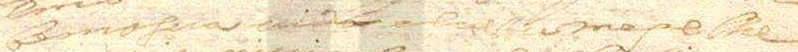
bem a sua uida e custumes e lhe
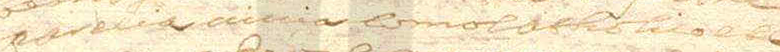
parecia uiuia como catholico e te
